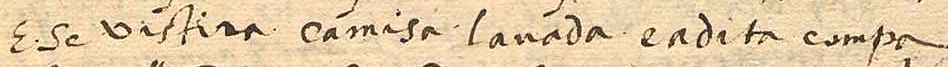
E se vistira camisa lauada e a dita compa
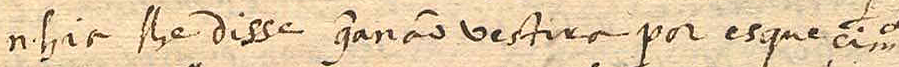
nhia lhe disse q̅ a na̅o vestira por esqueçimto
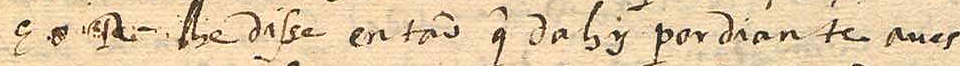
E o R. lhe disse enta̅o q̅ daly por diante a ues
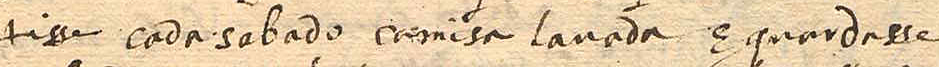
tisse cada sabado camisa lauada E guardasse
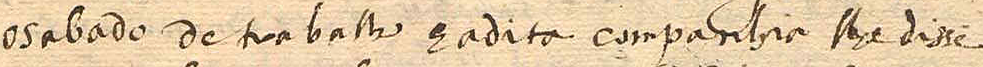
o sabado de trabalho E a dita companhia lhe disse
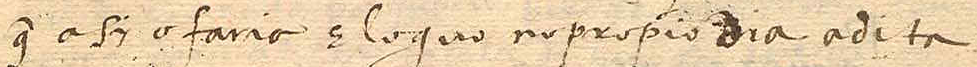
q̅ asy o faria E loguo no propio dia a dita
